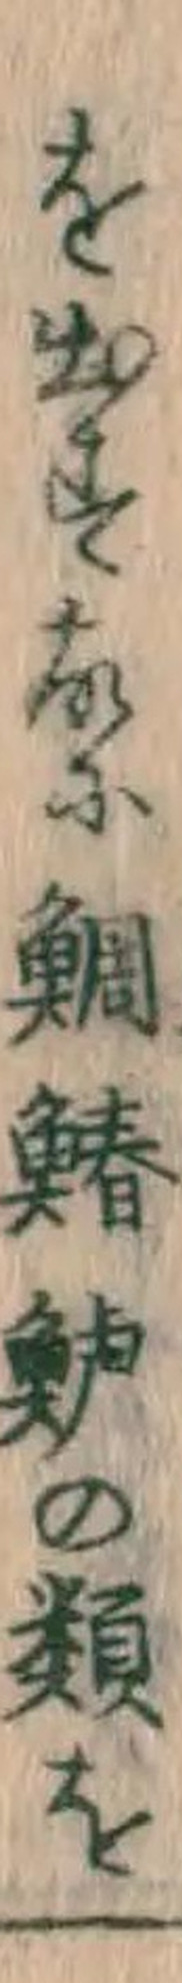を出す故に鯛鰆魲の類を
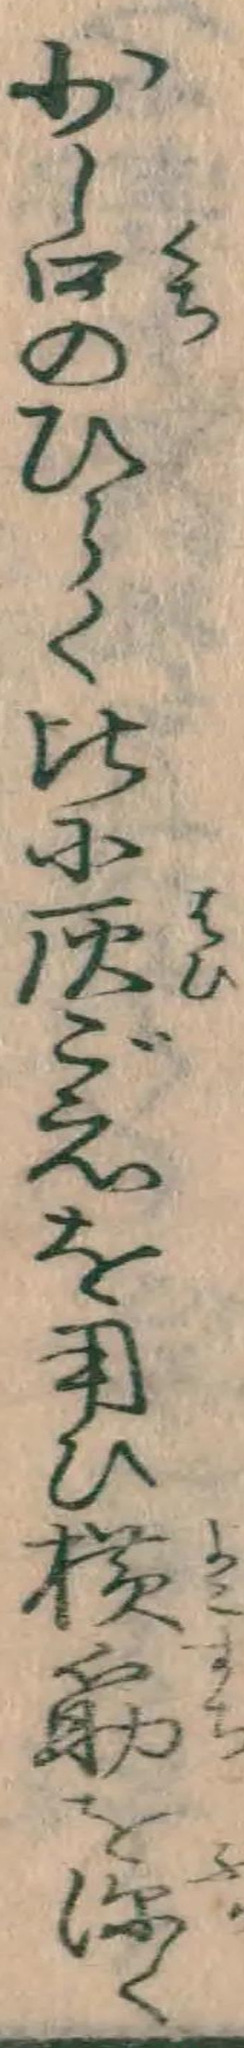少し口のひらく比に灰ごえを用ひ横筋を深く
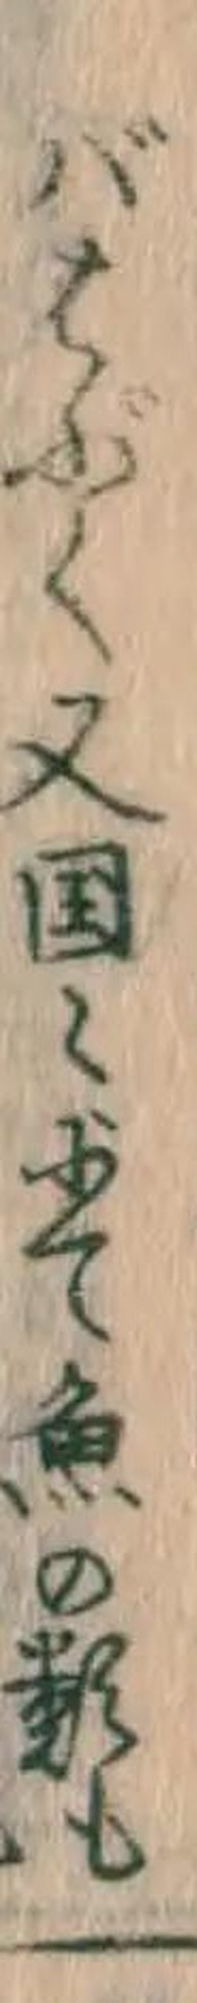ばはぶく又国々にて魚の類も
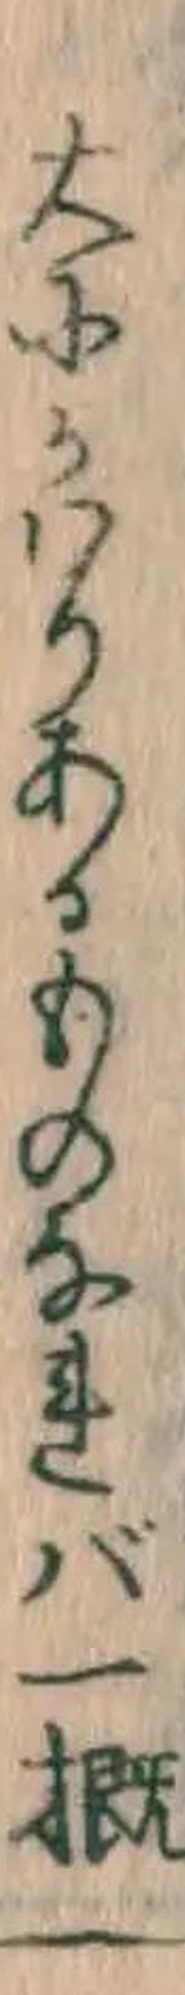大にかはりあるものなれば一概
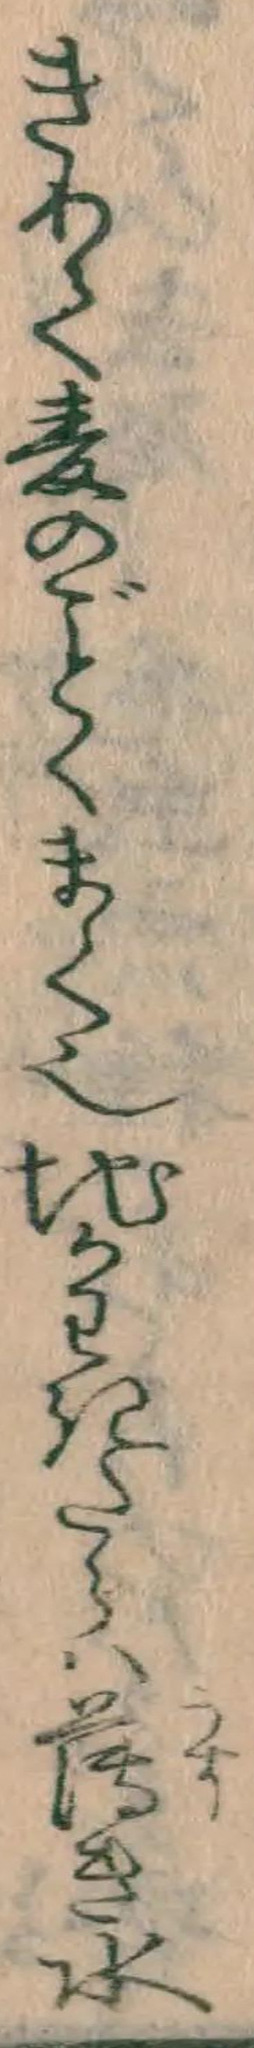きりて麦のごとくまく也地かわきたらは薄き水
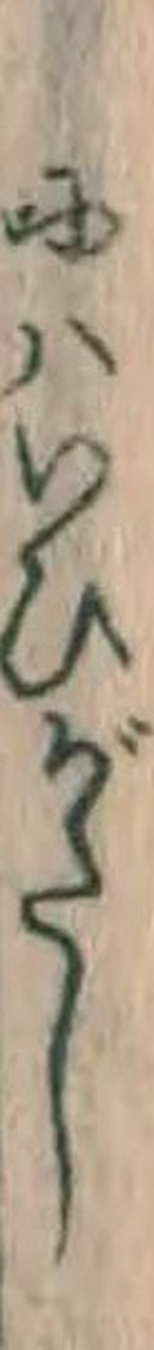にはいひがたし
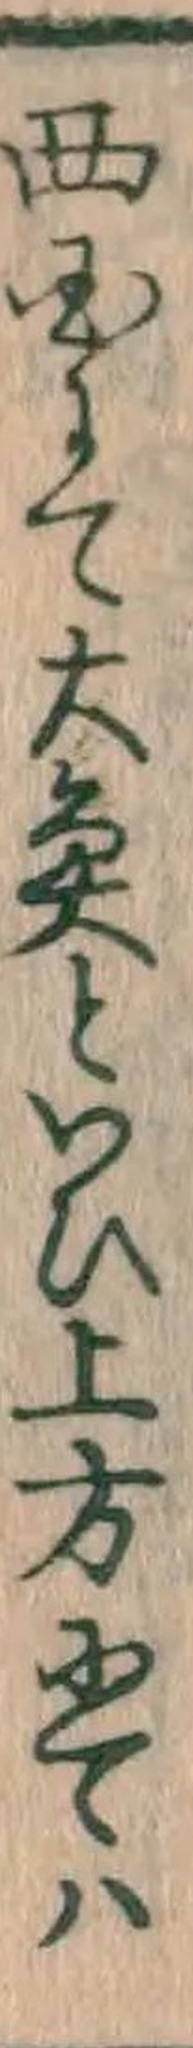西国にて大魚といひ上方にては
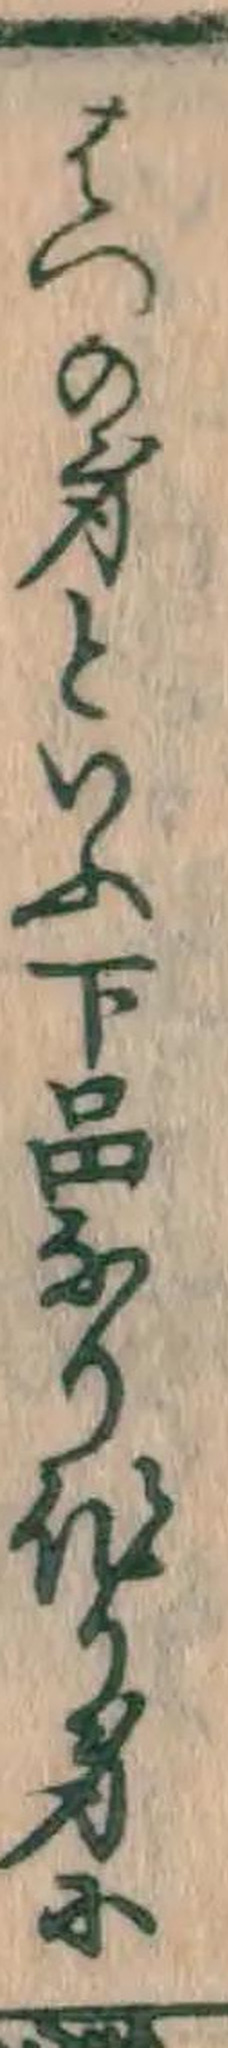はつの身といふ下品なり作り身に
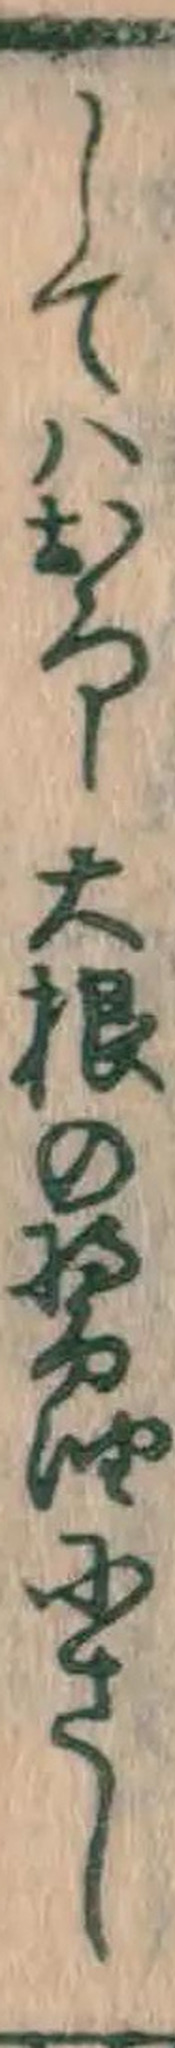してはおろし大根の醬油にさし
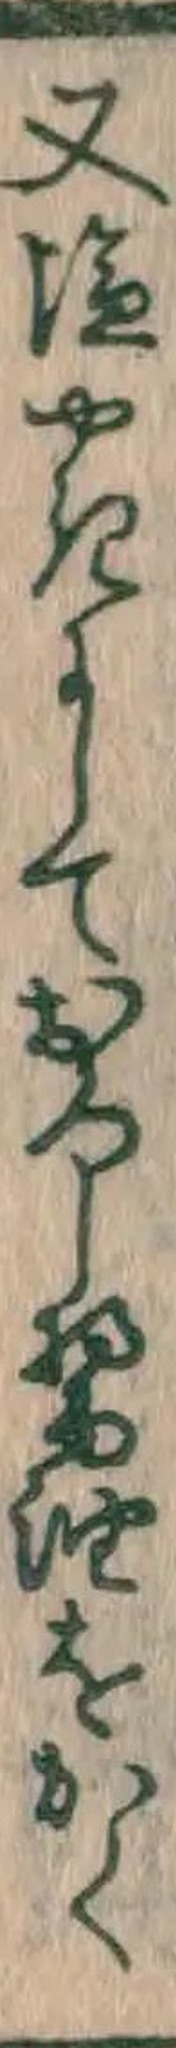又塩やきにしておろし醬油をかく
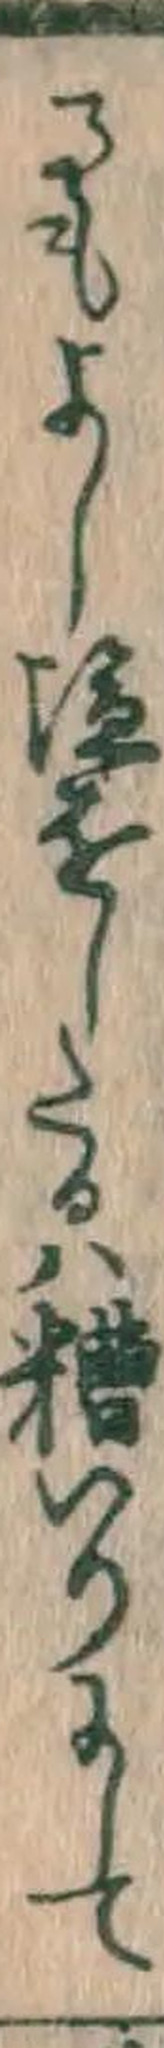るもよし塩をしたるは糟いりにして
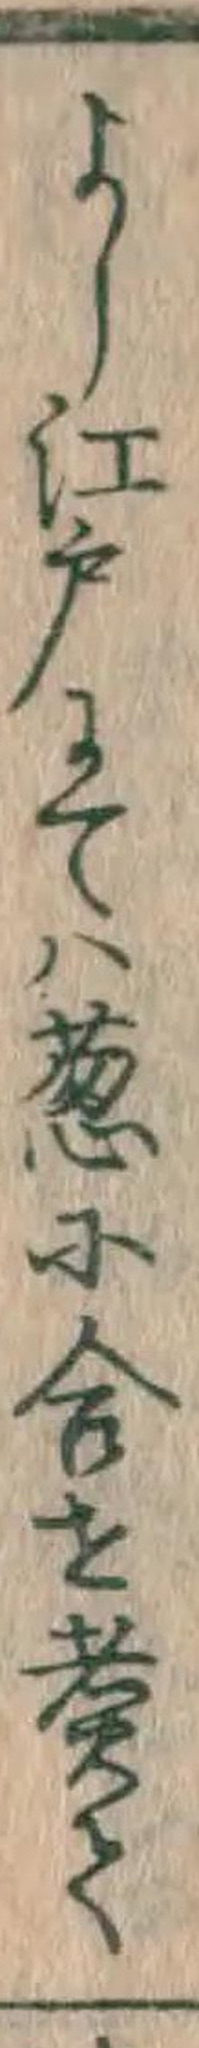よし江戸にては葱に合せ煮て
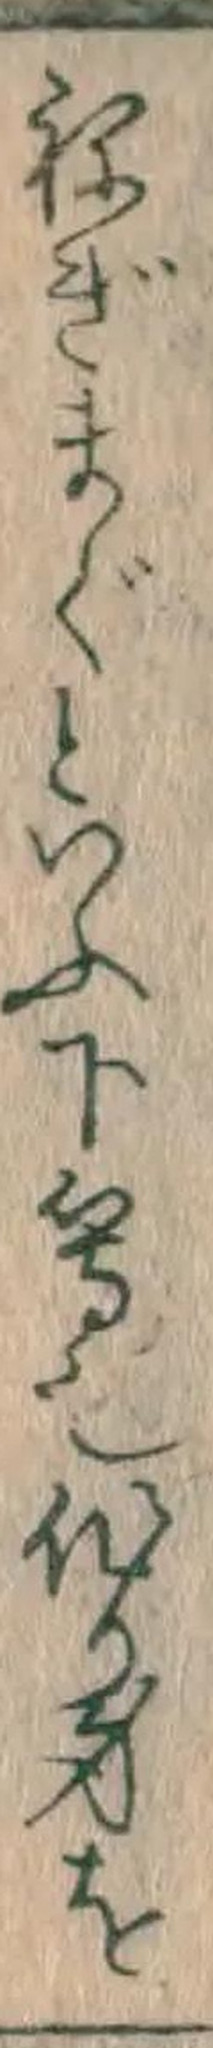ねぎまぐといふ下等也作り身を
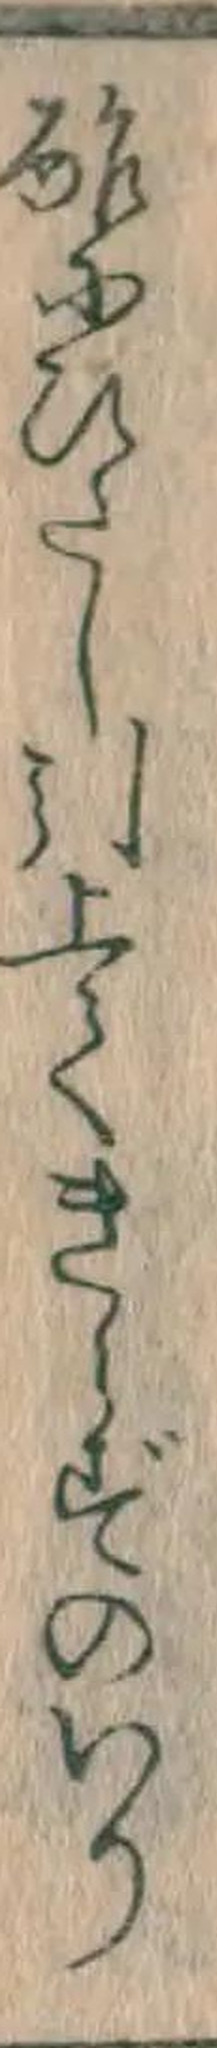酢にひたし引上てきらずのいり
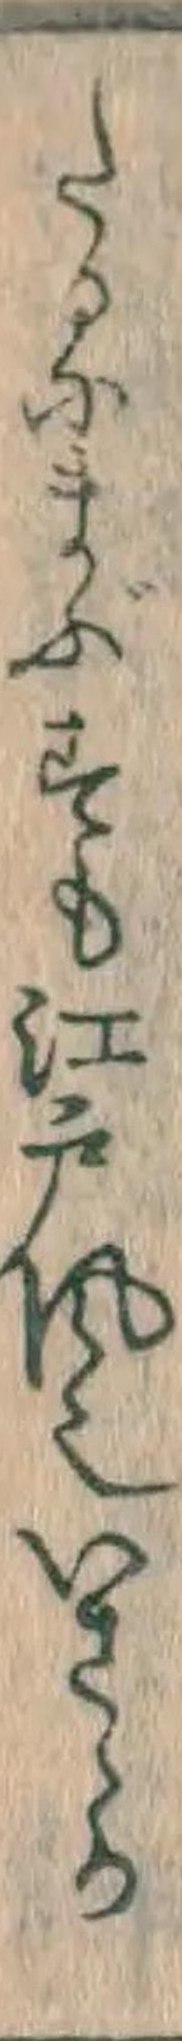たるにまぶすも江戸風也いさゝか
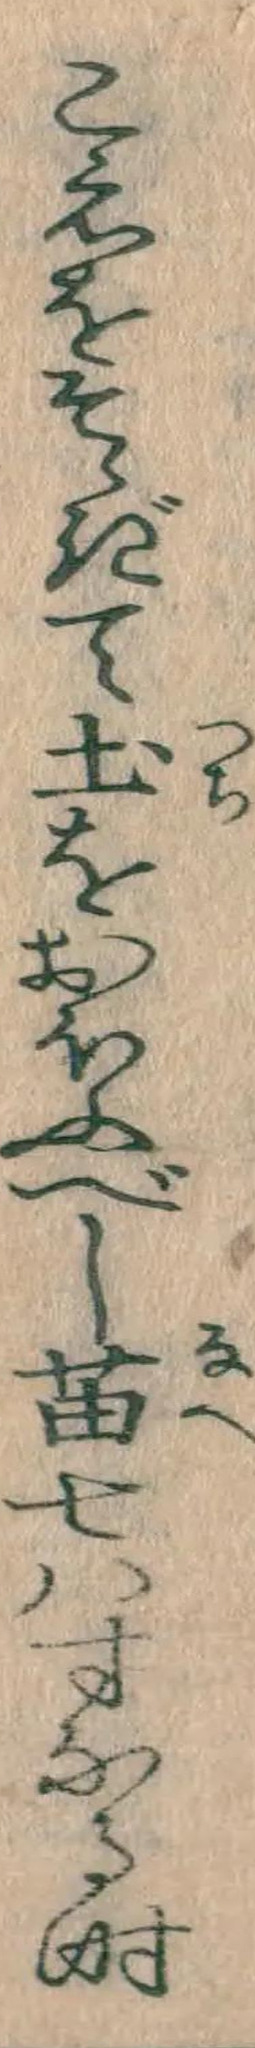こえをそゝぎて土をおほふべし苗七八寸なる時
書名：広益秘事大全 3巻. [5]
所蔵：国立国会図書館 National Diet Library, JAPAN
